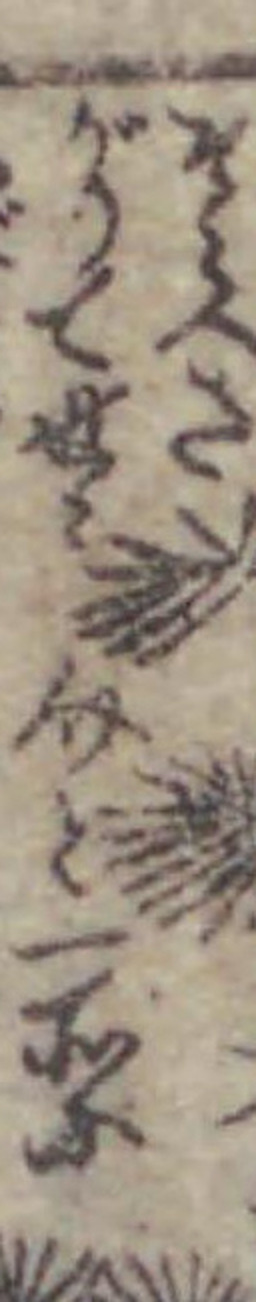がりて世之介と一所に
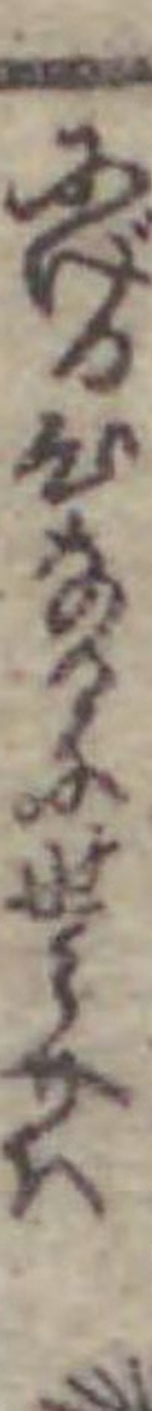にげる心なるに世之介は
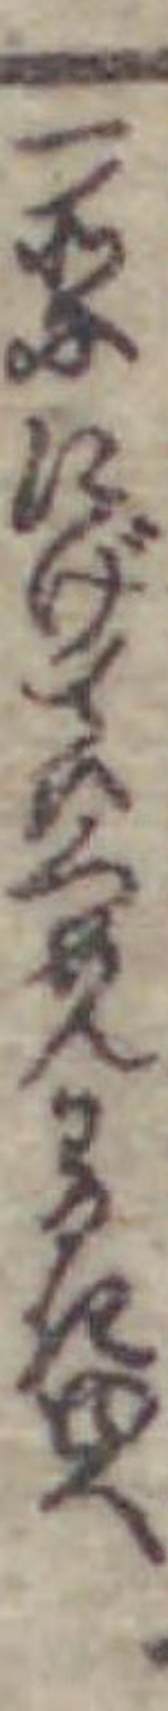一所ににげてはくめんわるきゆへ
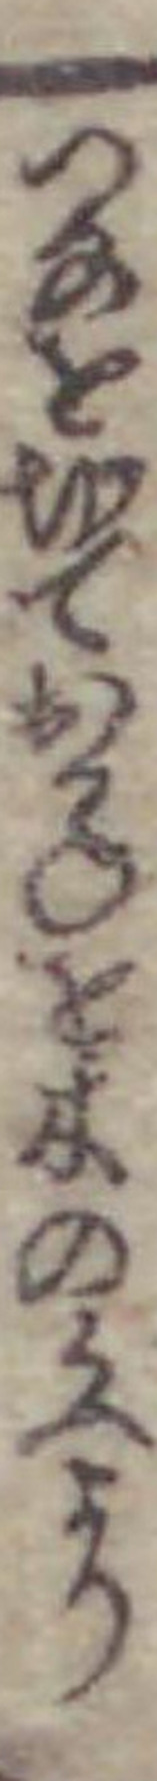つなを切ておかねを木のうへより
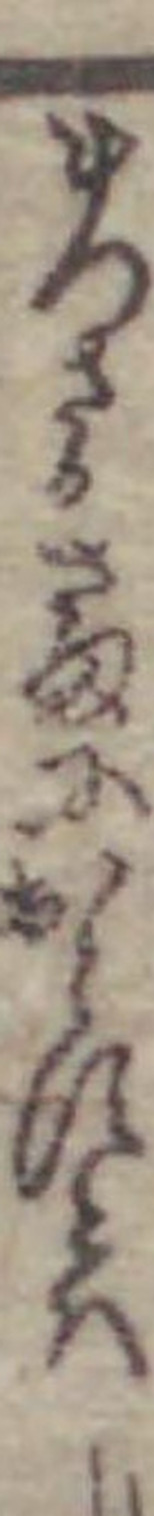まつさかさまにおとすとは
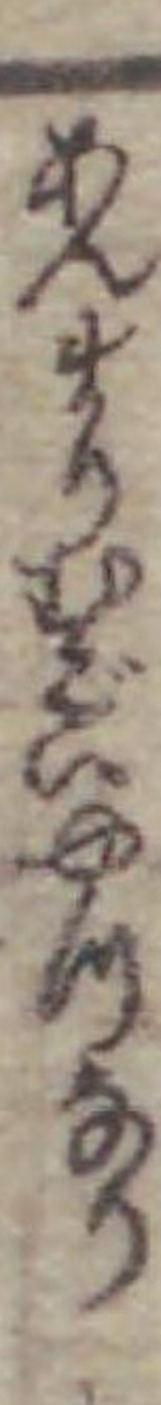あんまりむごいやつなり
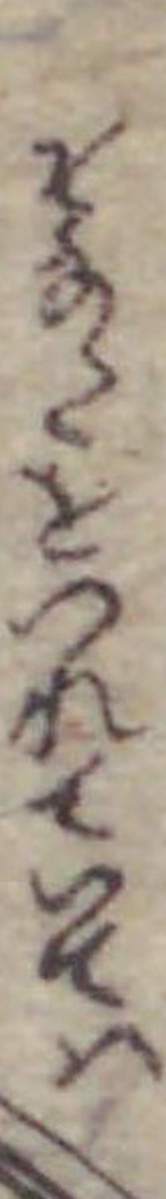そなたをつれていては
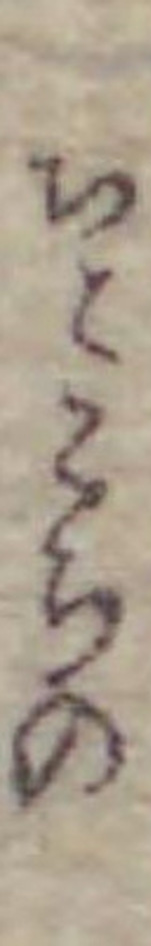ちとこちの
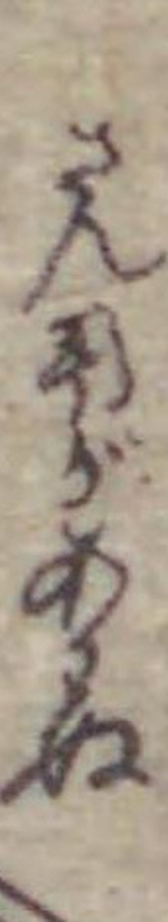さん用があわぬ
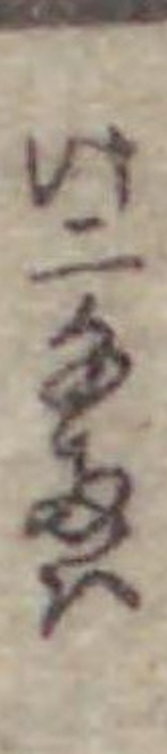此二千両は
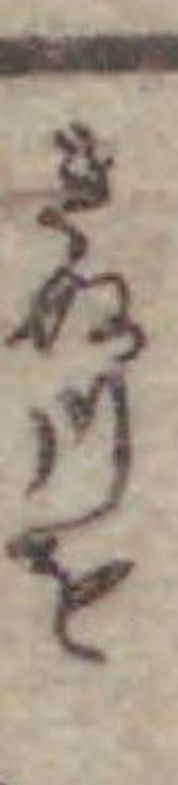きぬ川を
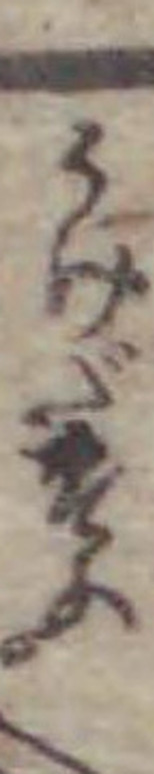うけだそふ
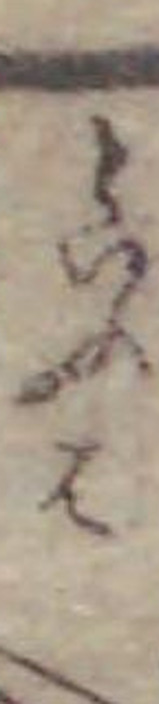といふは
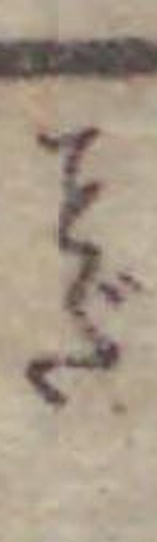ことだ

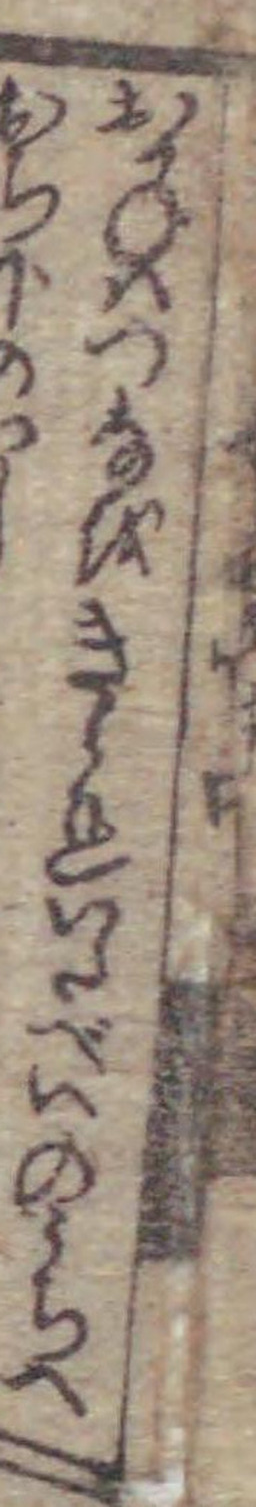おかねはつなをきられいたべいのうちへ
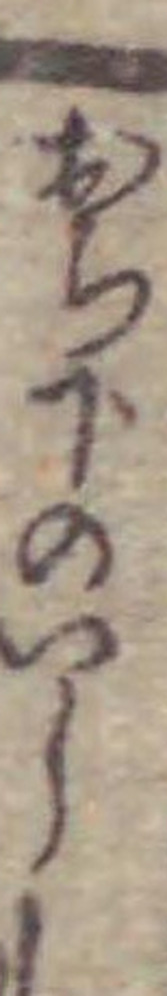おち下のいし
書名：嗚呼不侭世之助噺 : 3巻
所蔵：国立国会図書館 National Diet Library, JAPAN
